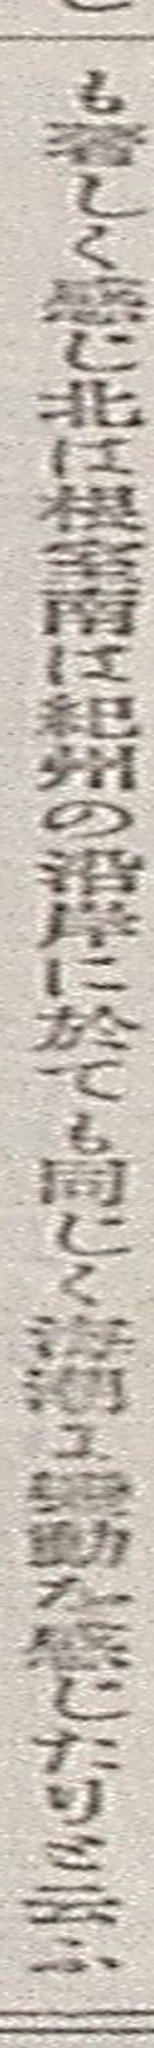も著しく感じ北は根室南は紀州の沿岸に於ても同じく海潮に震動を感じたりと云ふ
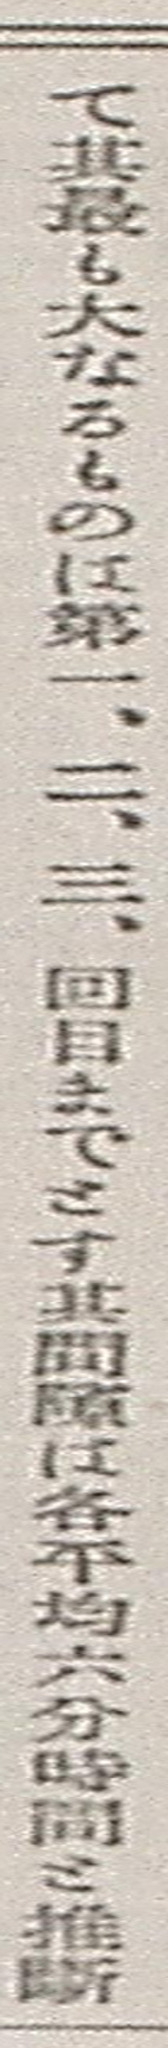て其最も大なるものは第一、二、三、回目までとす其間隙は各平均六分時間と推断
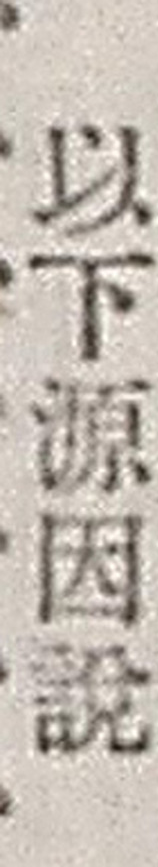以下源因説
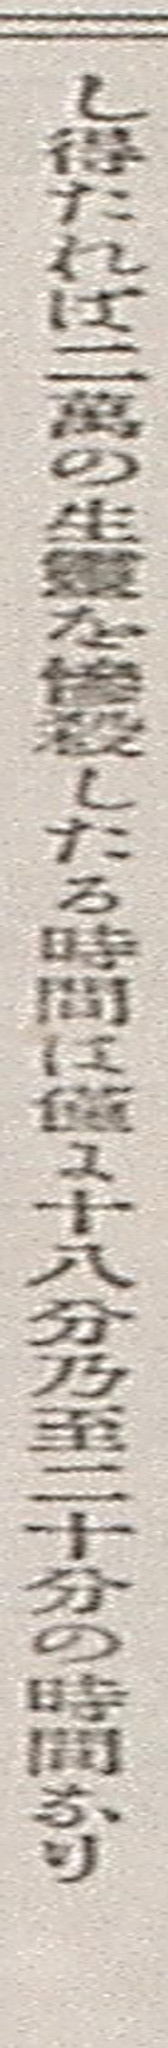し得たれば二万の生霊を惨殺したる時間は僅に十八分乃至二十分の時間なり
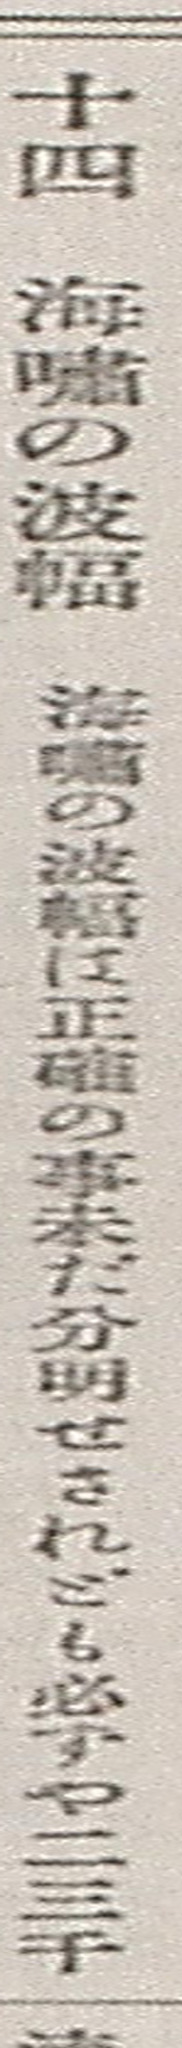十四海嘯の波幅海嘯の波幅は正確の事未だ分明せされども必ずや二三千
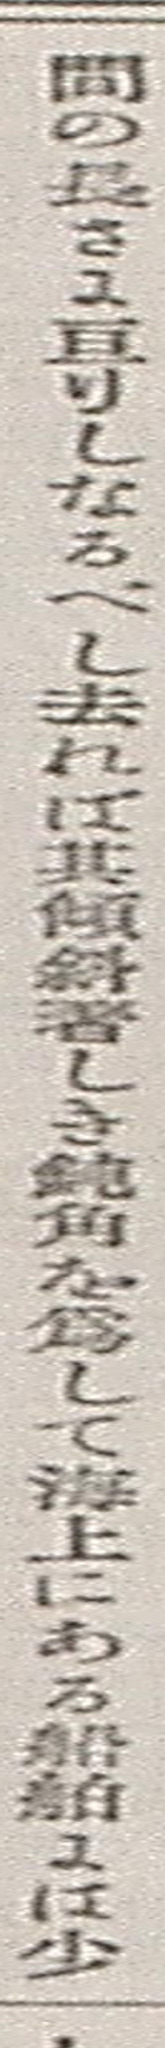間の長さに亘りしなるべし去れば其傾斜著しき鈍角を為して海上にある船舶には少
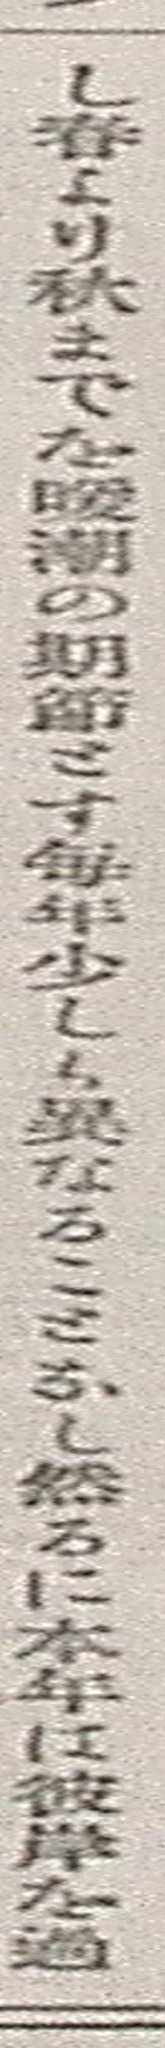し春より秋までを暖潮の期節とす毎年少しも異なることなし然るに本年は彼岸を過
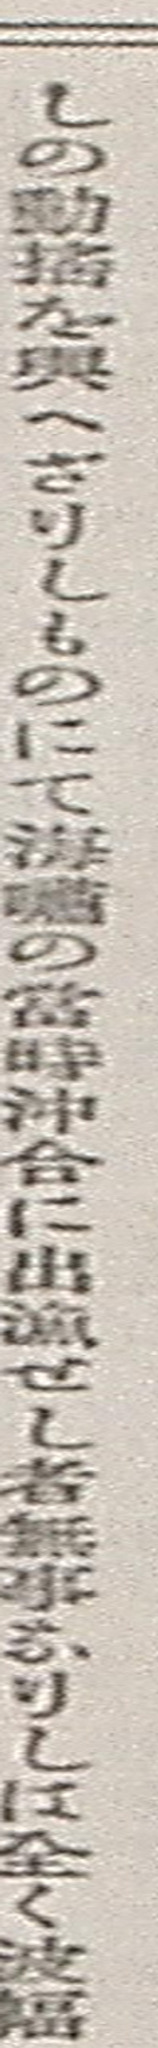しの動揺を与へざりしものにて海嘯の当時沖合に出漁せし者無事なりしは全く波幅
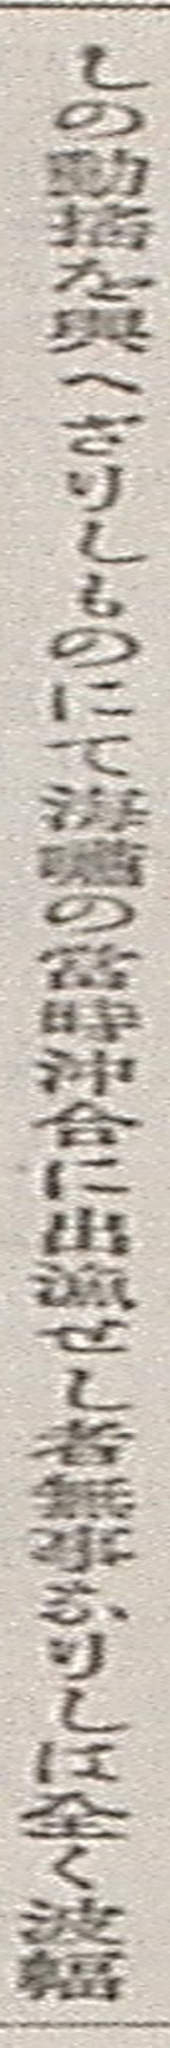しの動揺を与へざりしものにて海嘯の当時沖合に出漁せし者無事なりしは全く波幅
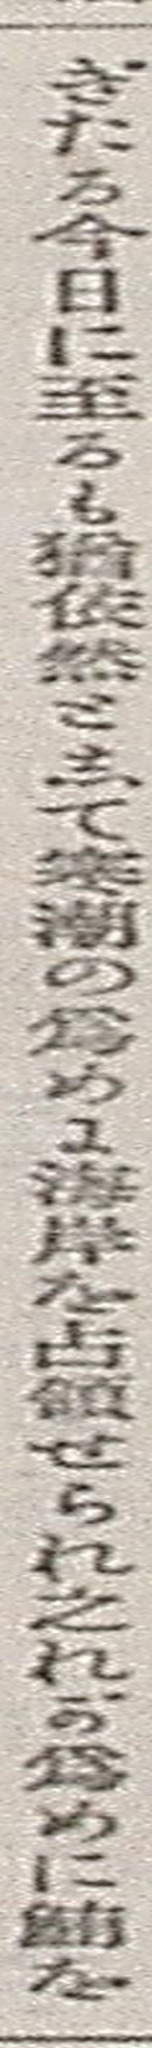ぎたる今日に至るも猶依然として寒潮の為めに海岸を占領せられ之れが為めに鮪を
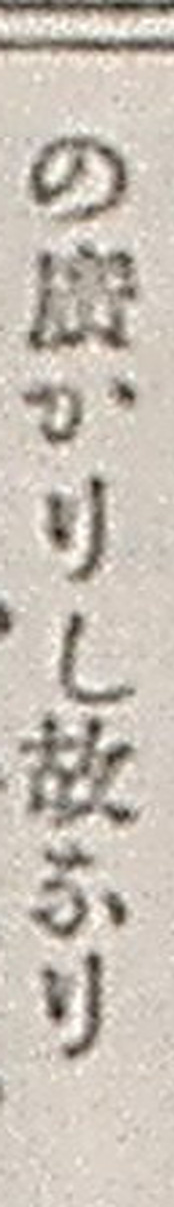の広かりし故なり
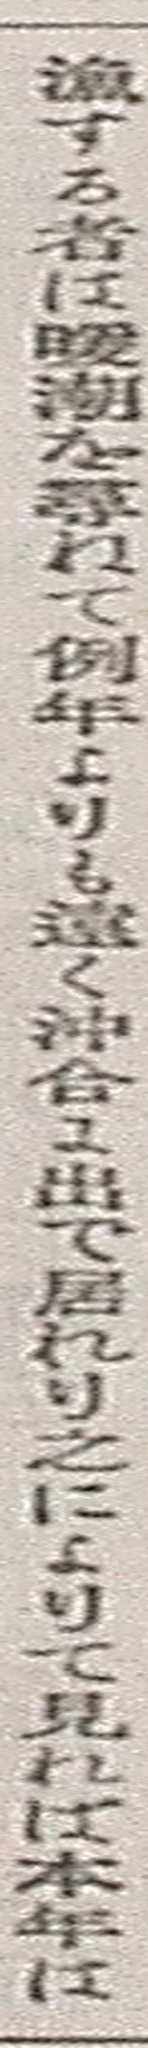漁する者は暖潮を尋ねて例年よりも遠く沖合に出で居れり之によりて見れば本年は
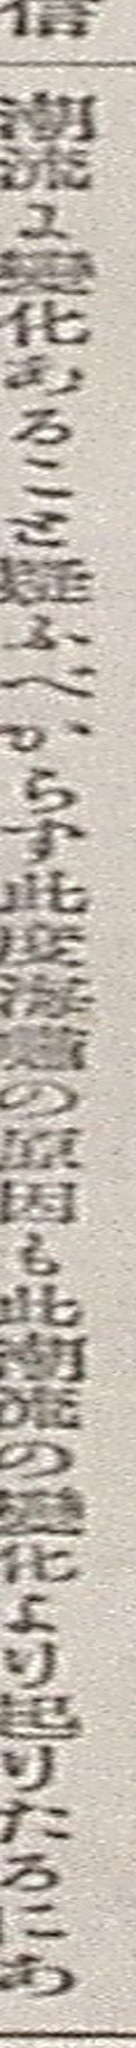潮流に変化あること疑ふべからず此度海嘯の原因も此潮流の変化より起りたるにあ
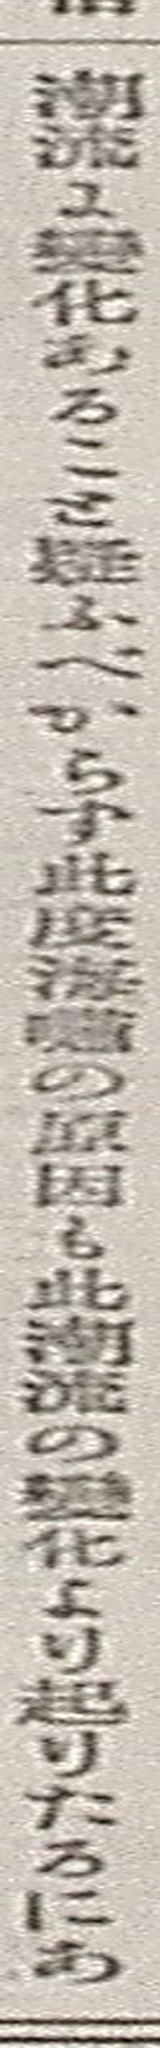潮流に変化あること疑ふべからず此度海嘯の原因も此潮流の変化より起りたるにあ
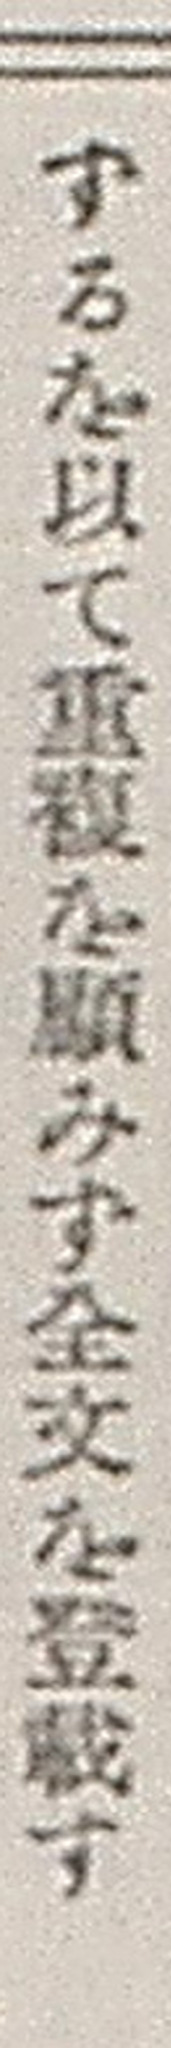ずるを以て重複を顧みず全文を登載す
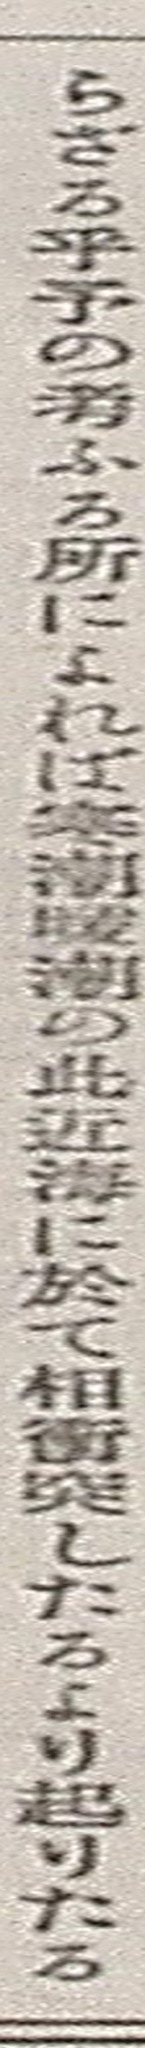らざる乎予の考ふる所によれば寒潮暖潮の此近海に於て相衝突したるより起りたる
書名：風俗畫報臨時増刊第百十九號　大海嘯被害録（中）
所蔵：東京大学地震研究所図書室 Earthquake Research Institute Library, The University of Tokyo, JAPAN
